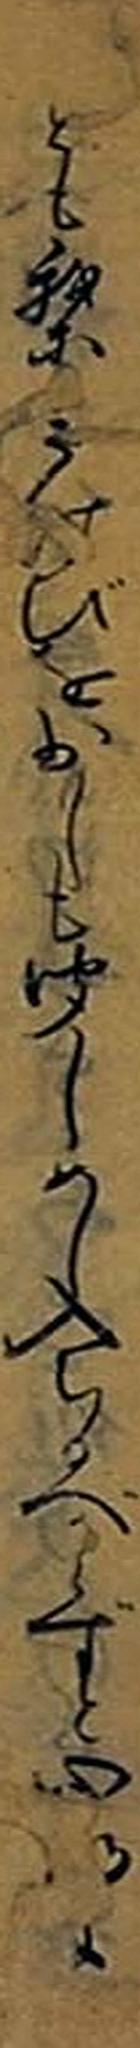とも我等けびを少しも聞しめし入らるべからずと
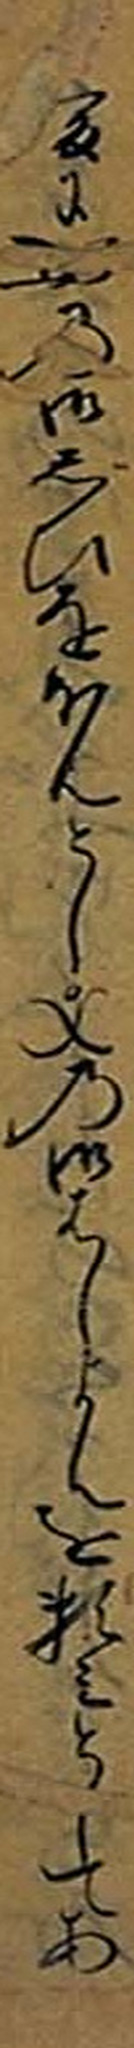爰にの御じひをほんとし◦✕の御はしよんを頼みとしてあ
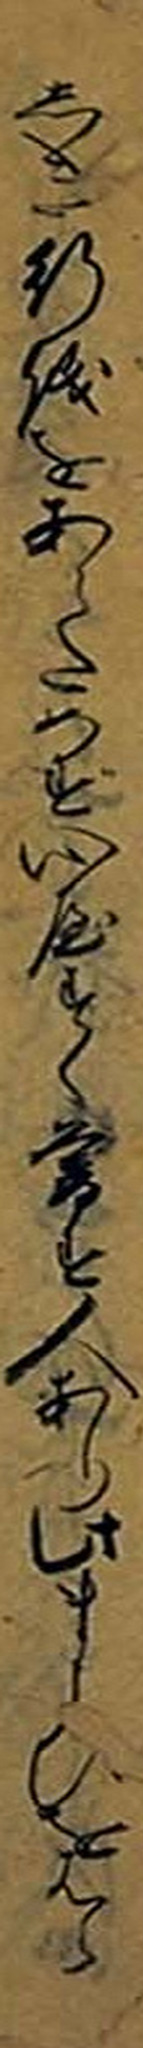しき行儀をあらためず心やすく暮す人あり此まよひをはら
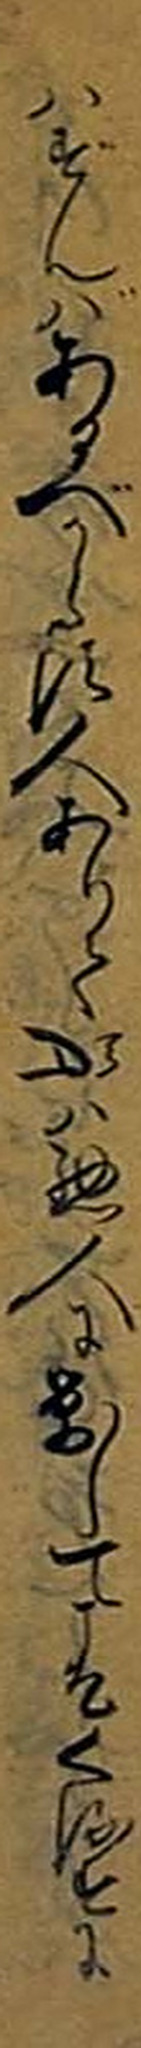はずんばあるべからす人ありてⅮは悪人に対してこそくるすに
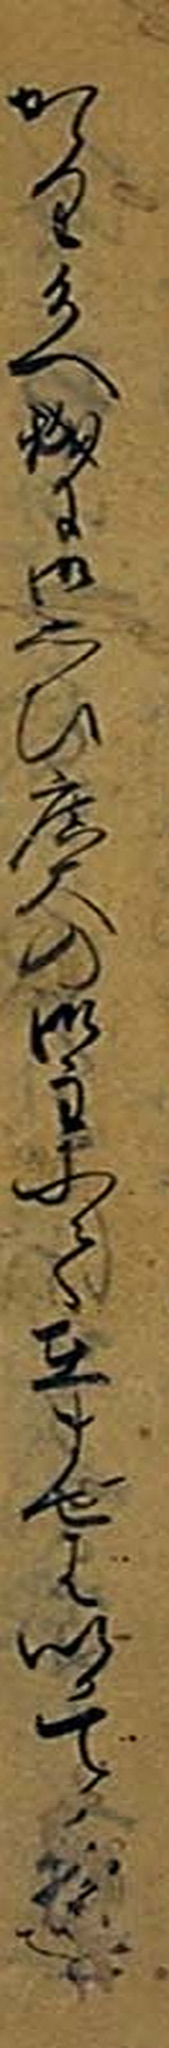かゝり給へ誠に御じひ広大の御主にて在ませばいかでを
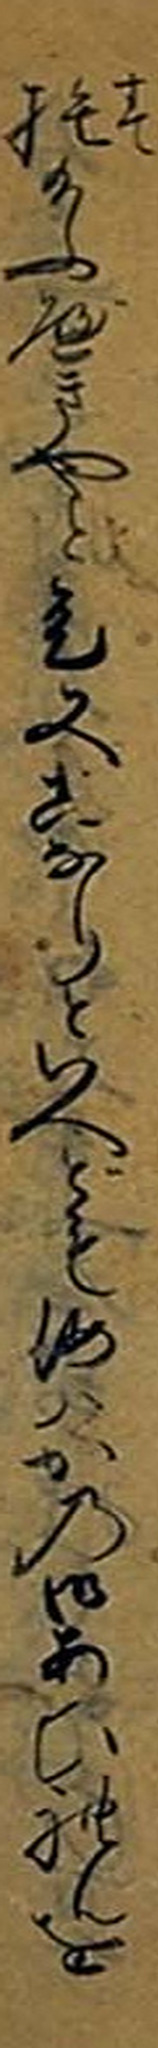捨給ふべきやと是又真なりといへども汝はかの御あひれんを
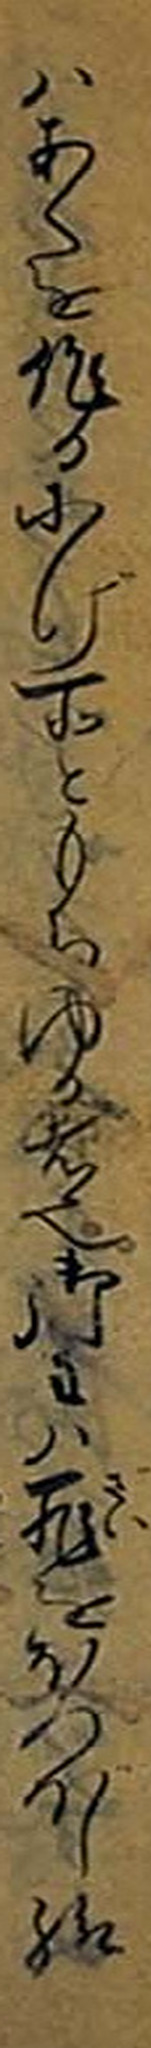はあくを作るにげ所ともちゆる者也御主は罪をほろぼし給

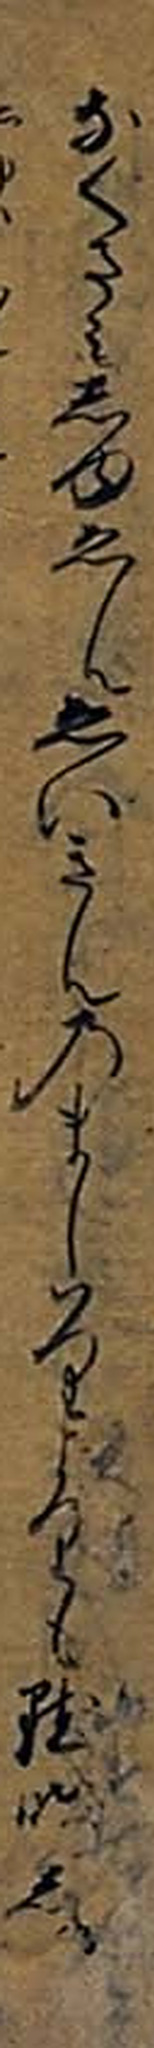なくさみしゆゑんゑいきんのましはりよりも黙
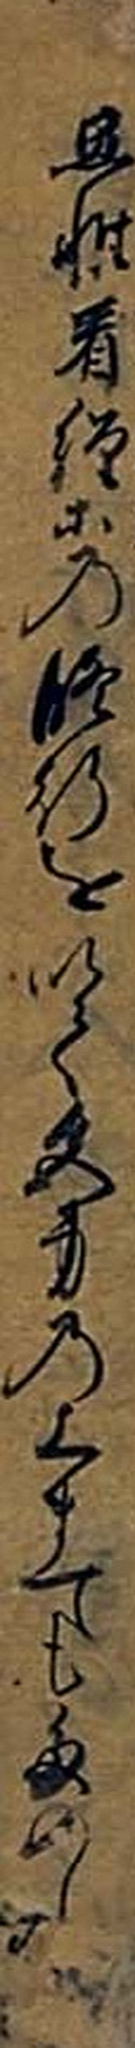思惟看経等の修行を以て色身の上まてもたのし
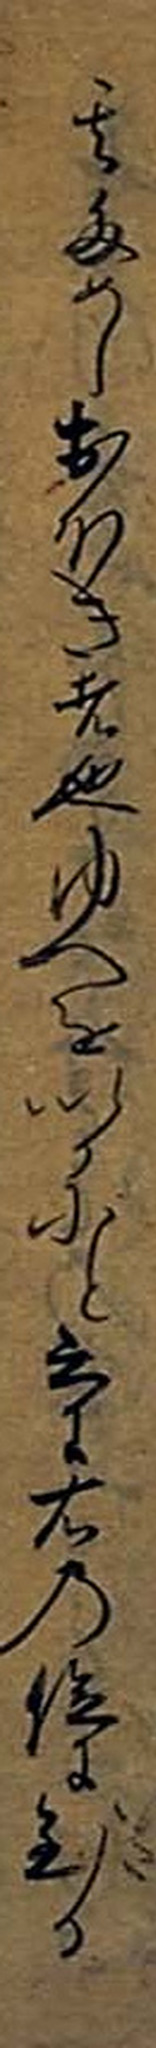其ためしおほき者也ゆへをいかにと云に右の位に至る
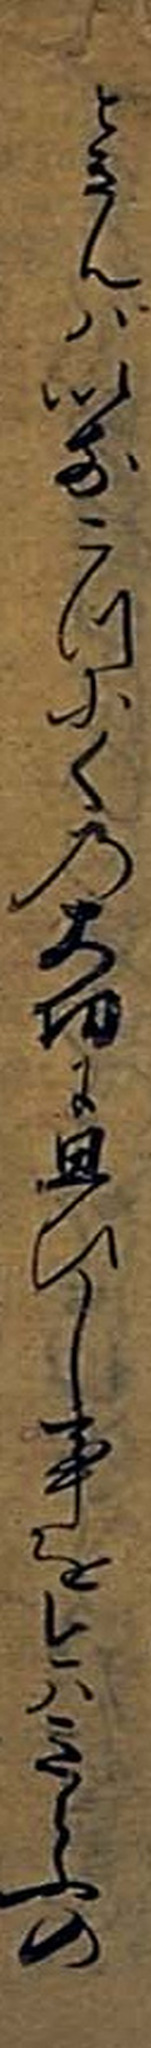ときんば以前こつにくの大切に思ひし事を今はきらふの
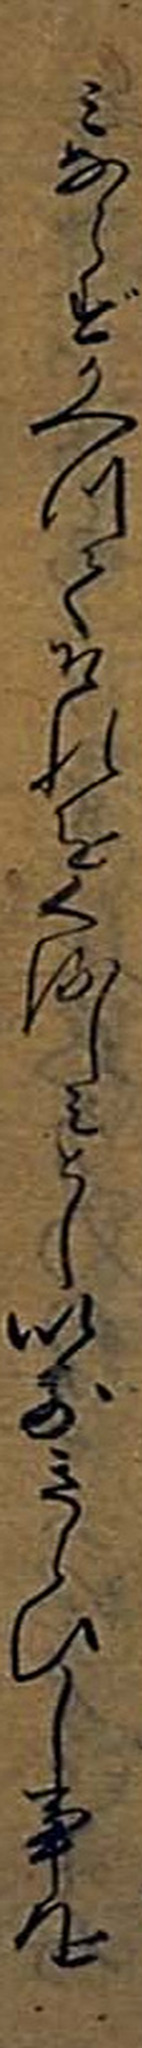みならずかへつてそれをくるしみとし以前きらひし事を
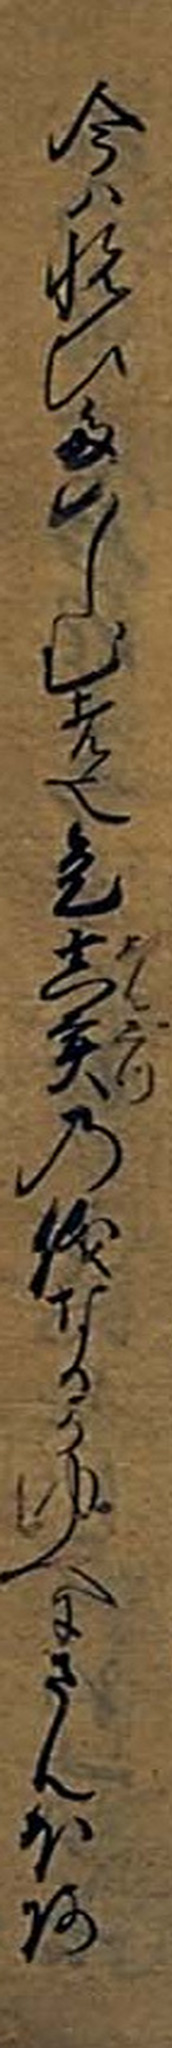今は悦ひたのしむ者也是真実の儀なるかゆへにさんほあ
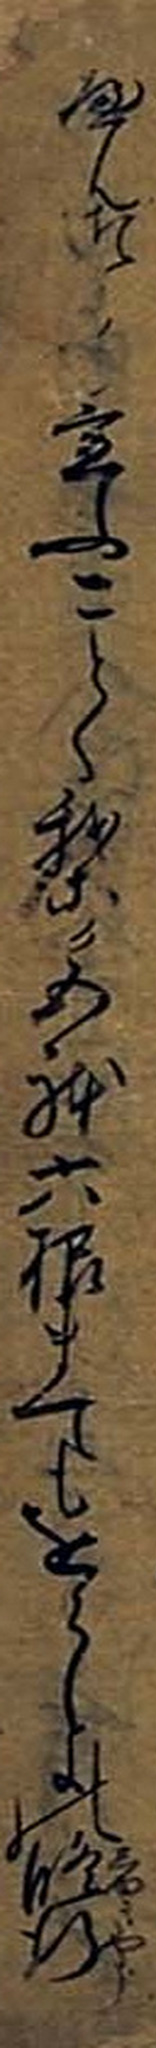へん宣ふことく我等か五体六根まてもをらしよの修行
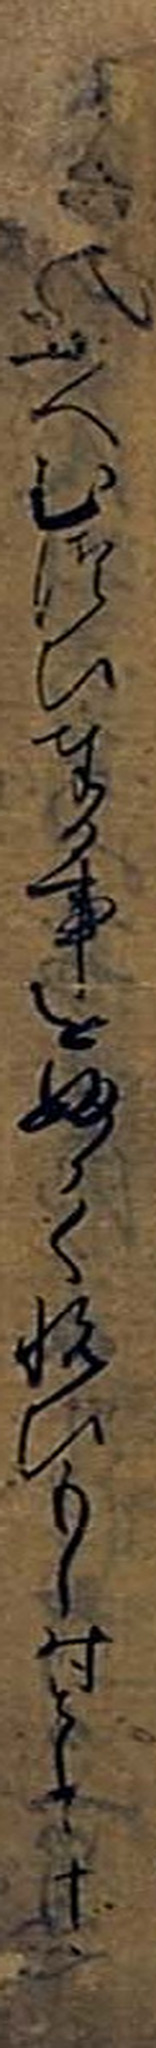へむつひ奉る事をふかく悦ひもし時として
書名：ぎやどぺかどる
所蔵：東京大学総合図書館 / General Library in the University of Tokyo
